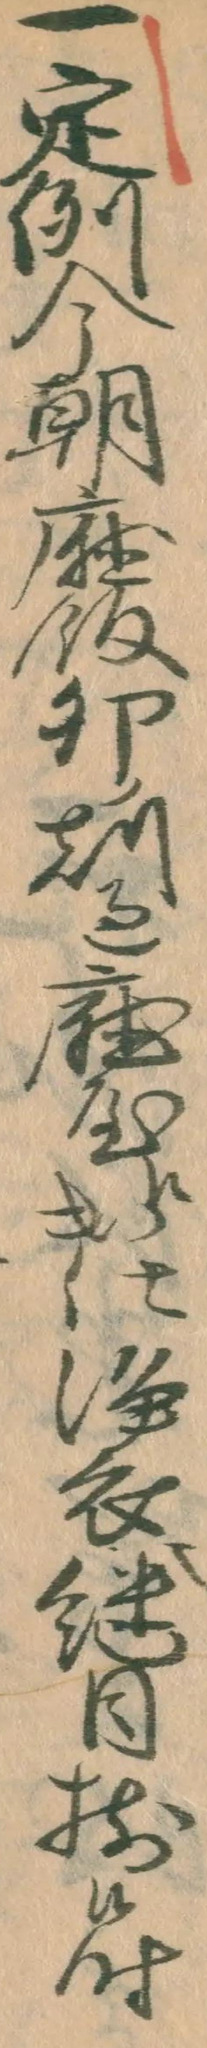一定例今朝庁飯卯ノ刻過庁屋江出仕浄衣也継目揃候時
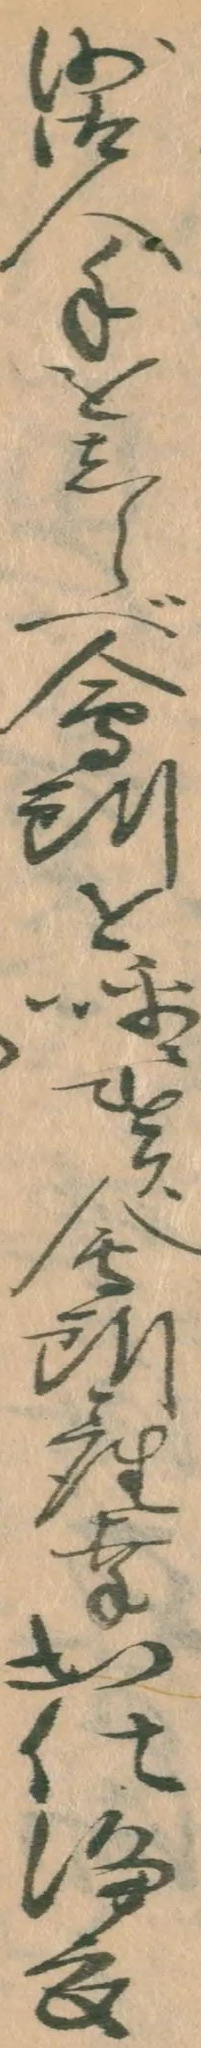沙汰人手をしらべ会所を呼ニ遣ス会所産幸出仕浄衣
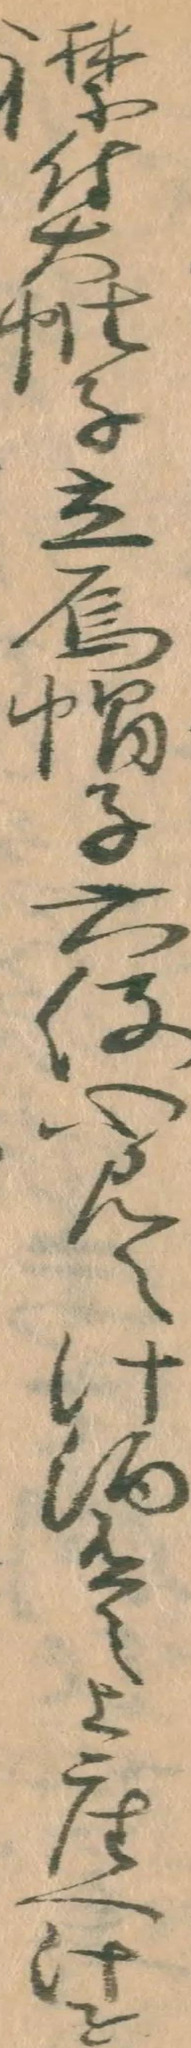襟付大帷子立烏帽子六役見之汁酒有之上座へ汁を
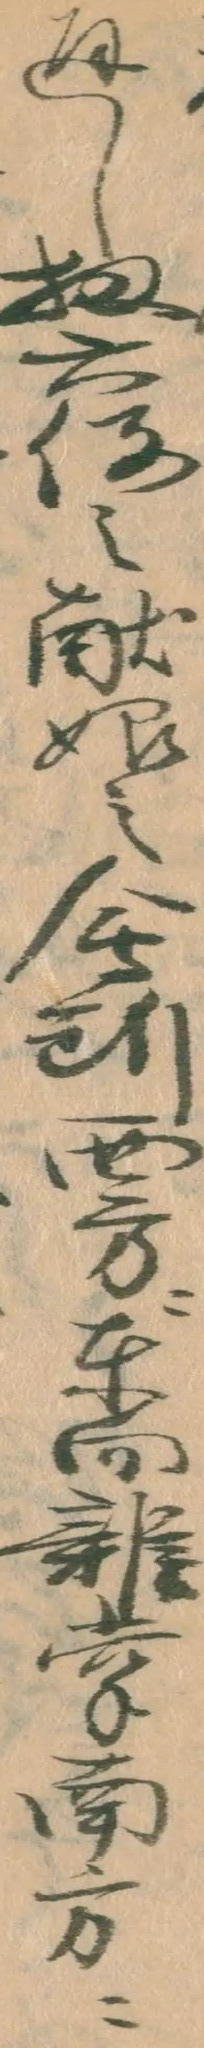通し扨六役之献始之会所西方ニ東向雑掌南方ニ
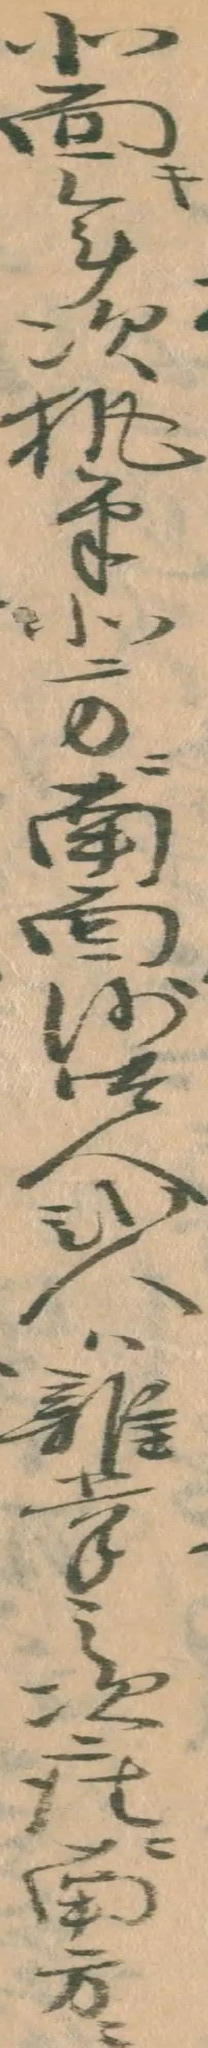北向キ年次執筆北方ニ南面沙汰人弐人ハ雑掌之次座ニ南方ニ
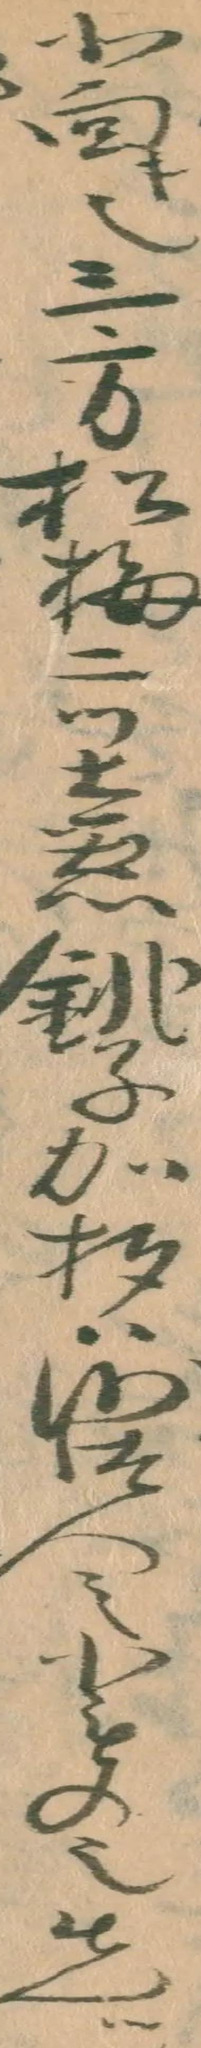北向キ也三方松梅二ツ土器銚子加杓ハ沙汰人之小もの也先ツ
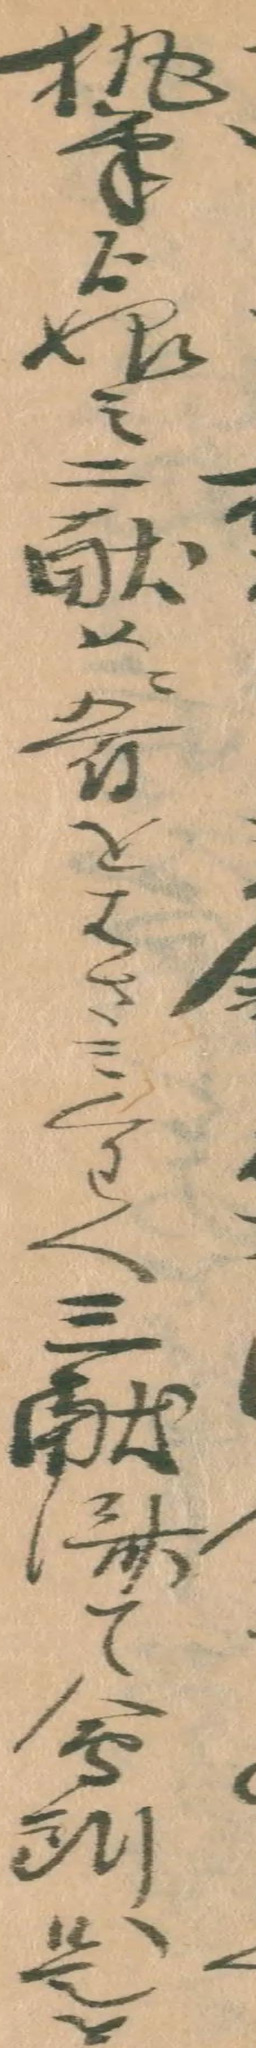執筆ゟ始之二献めニ肴をはさミくわへ三献済て会所へ是を
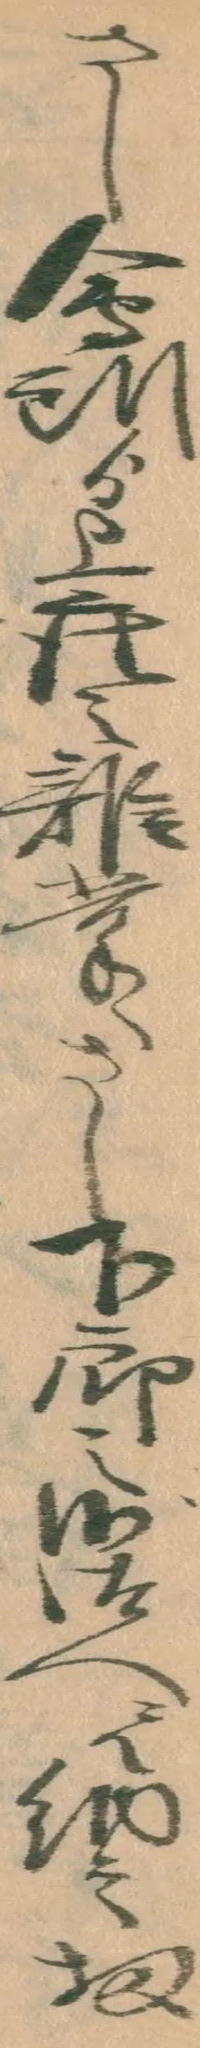さし会所ゟ上座之雑掌へさし下郎之沙汰人ニて納之扨
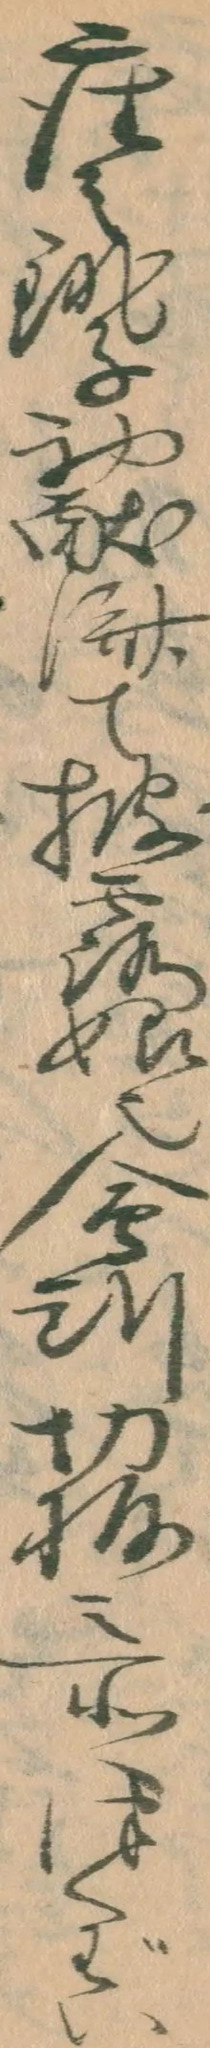座之銚子初献済て披露始也会所切板之所へつくばい
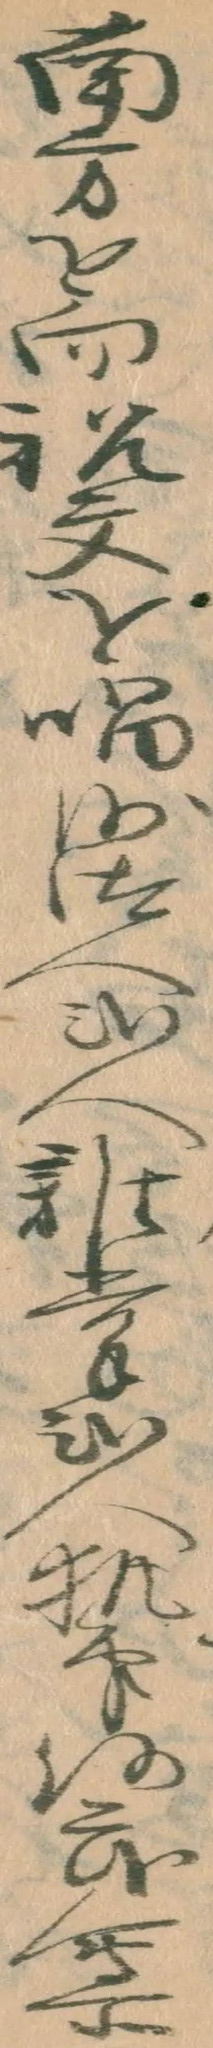南方を向祝文を唱沙汰人弐人雑掌弐人執筆何も会所
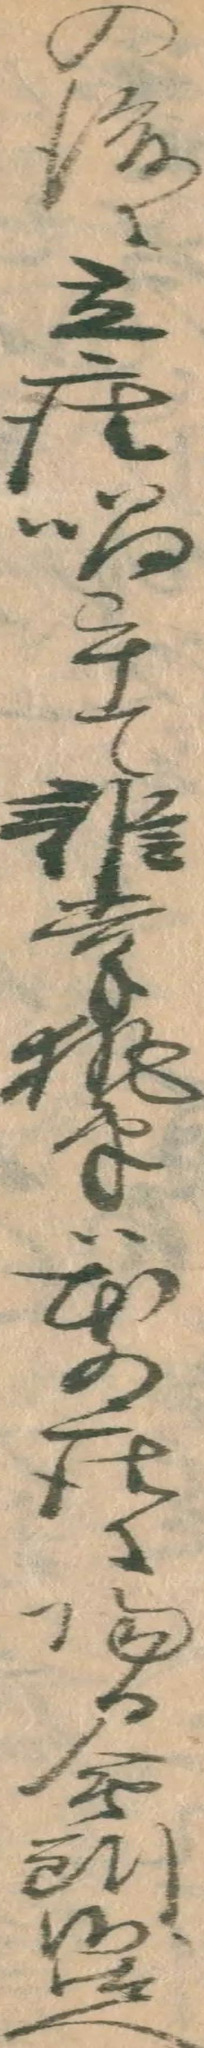の後に立座唱畢て雑掌執筆ハ本の座に帰る会所沙汰人
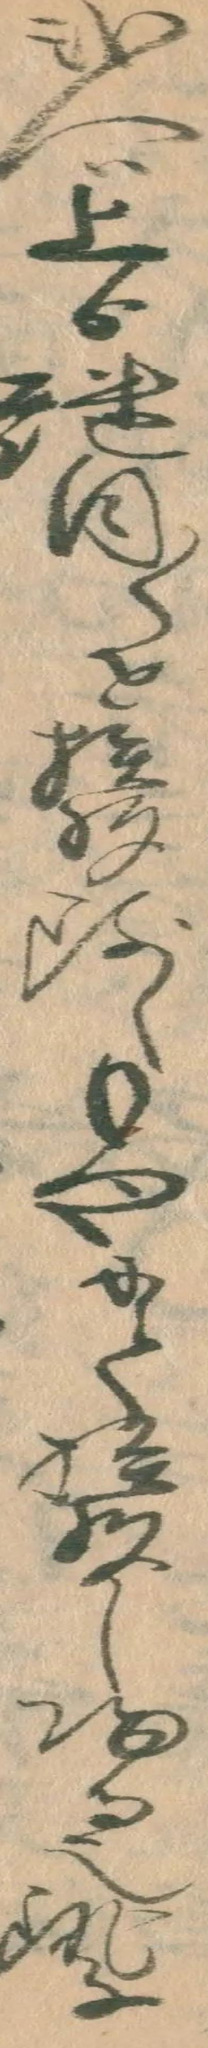弐人ハ上ゟ継目〳〵を挨拶致しにて挨拶し帰る也銚子
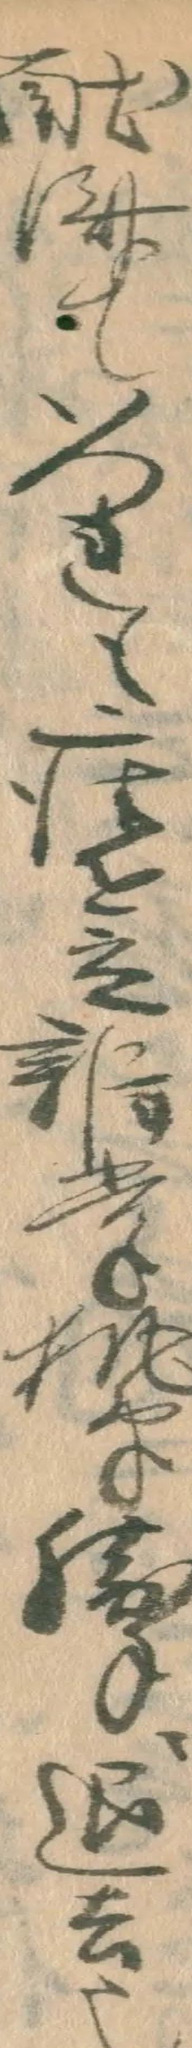献済ていつれも座を立雑掌執筆勝手ニ退去也
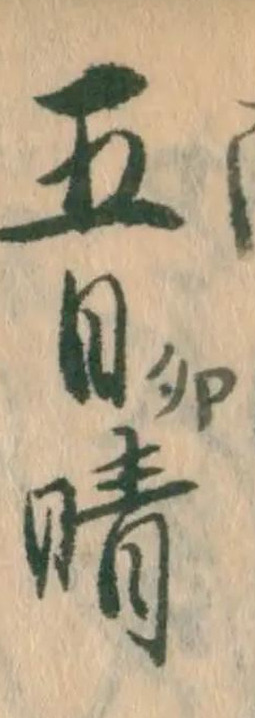五日卯晴
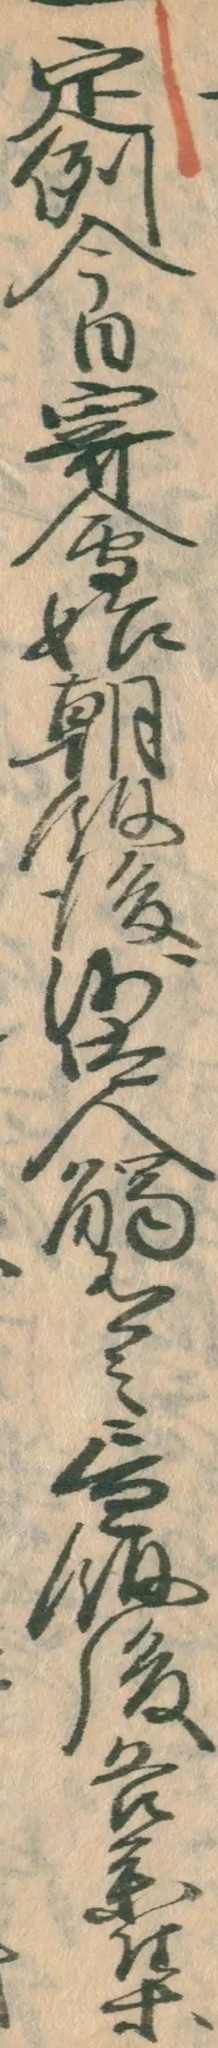一定例今日寄会始朝飯後沙汰人触有之昼飯後各参集
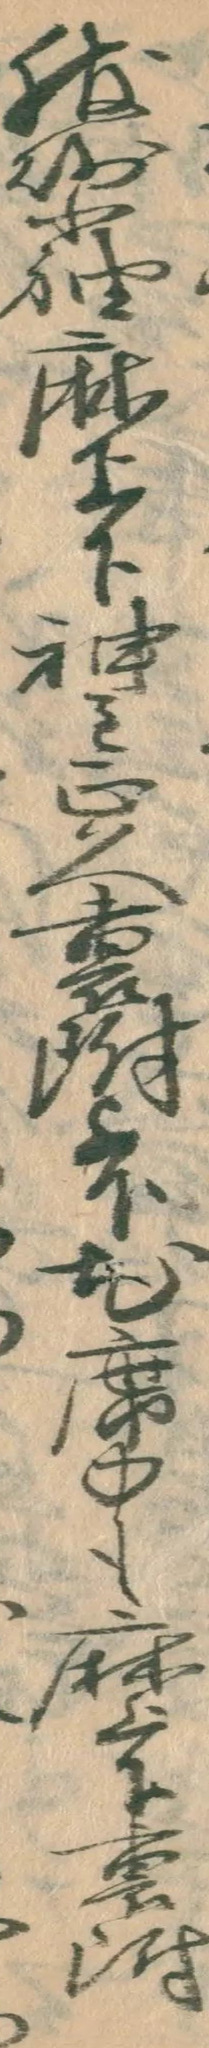服砂小袖麻上下神主正久裏附上下尤席中も麻上下裏附
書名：賀茂社記録. 第60冊
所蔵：国立国会図書館 National Diet Library, JAPAN
